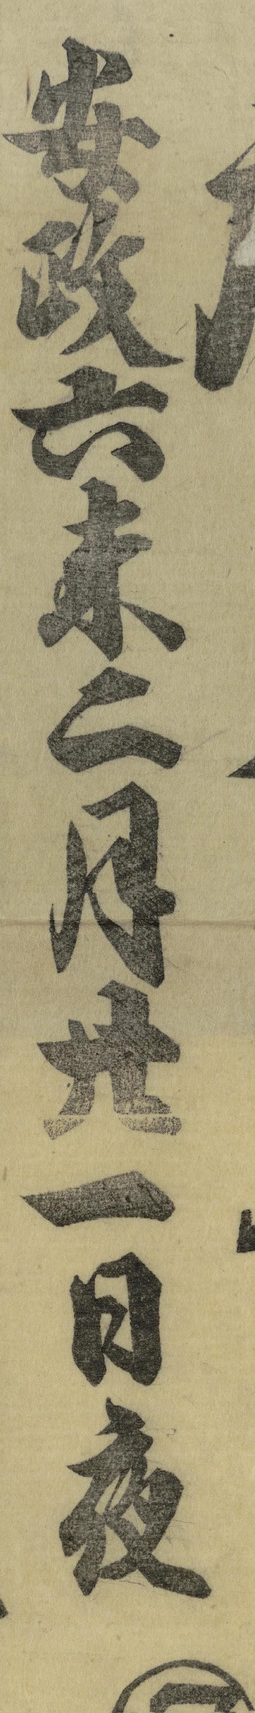安政六未二月廿一日夜
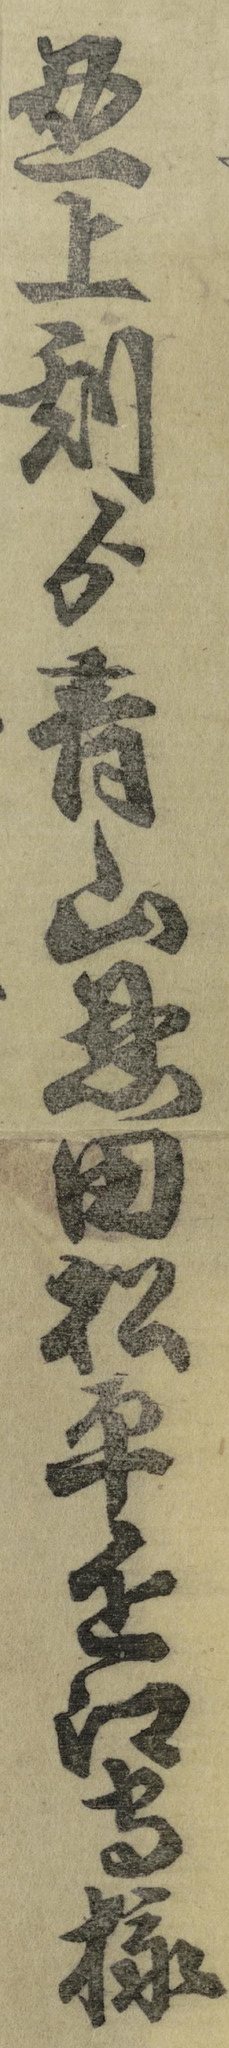丑上刻ゟ青山恩田松平近江守様
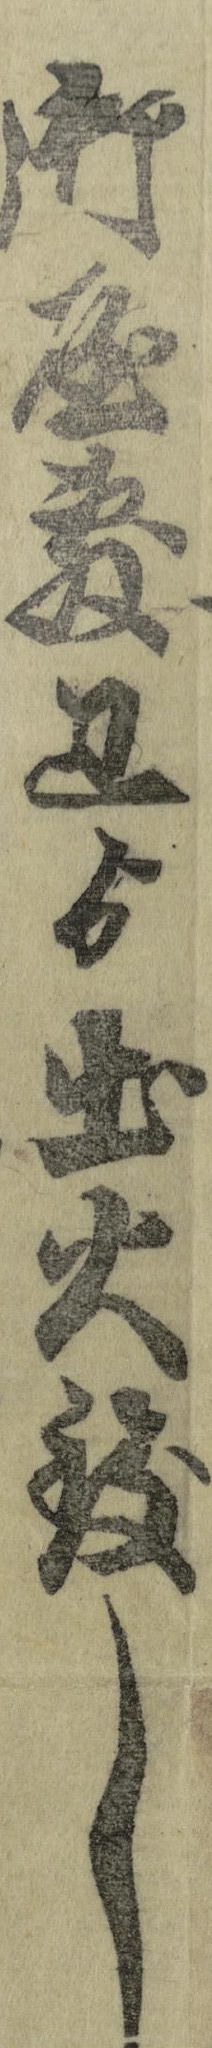御屋敷辺ゟ出火致し
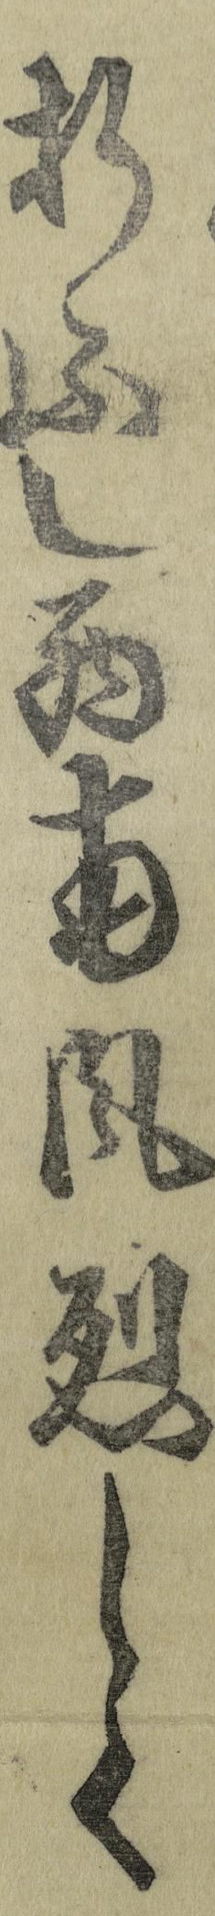折ふし西南風烈しく
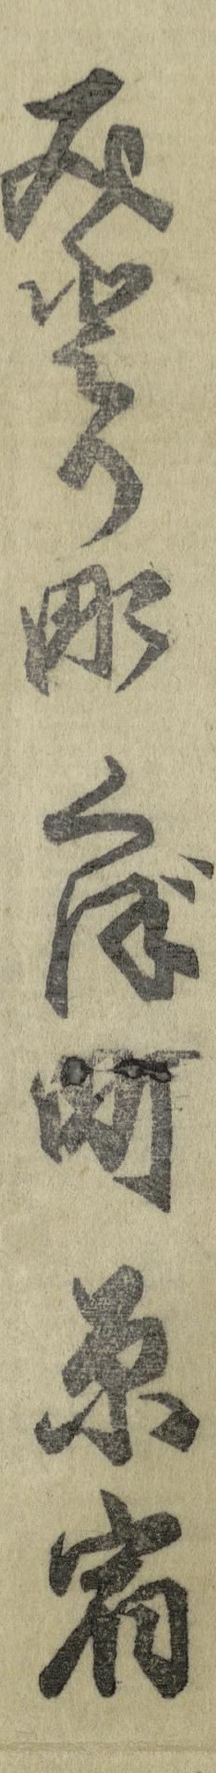みとり町くぼ町原宿
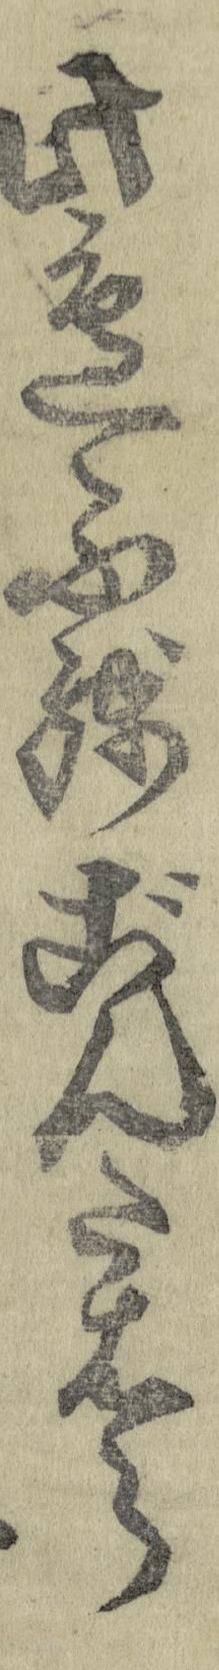此辺不残ごんたはら
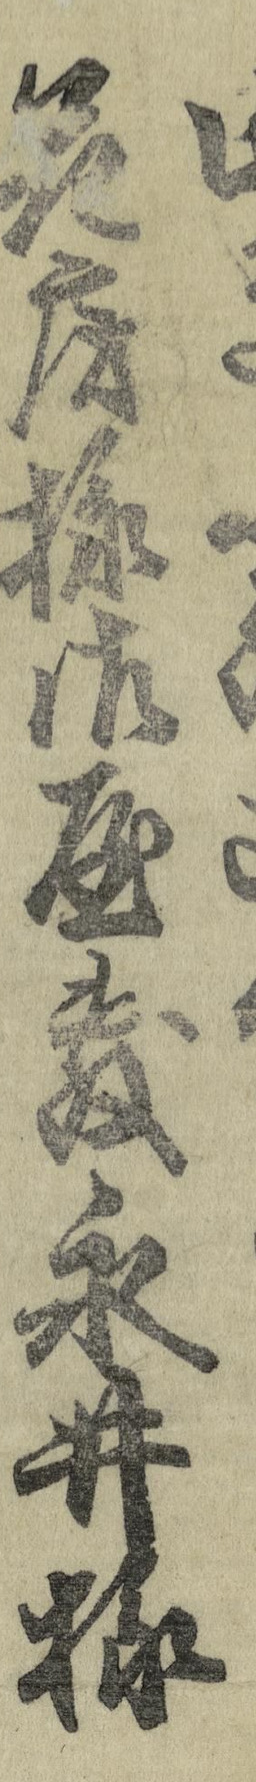花房様御屋敷永井様
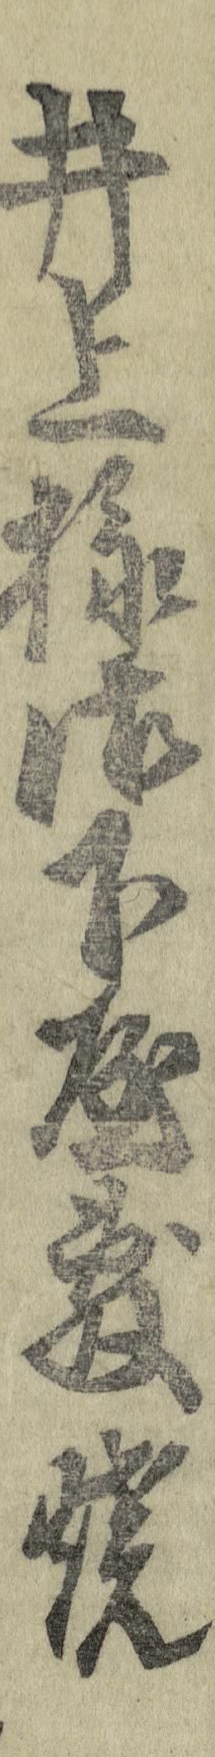井上様御下屋敷焼
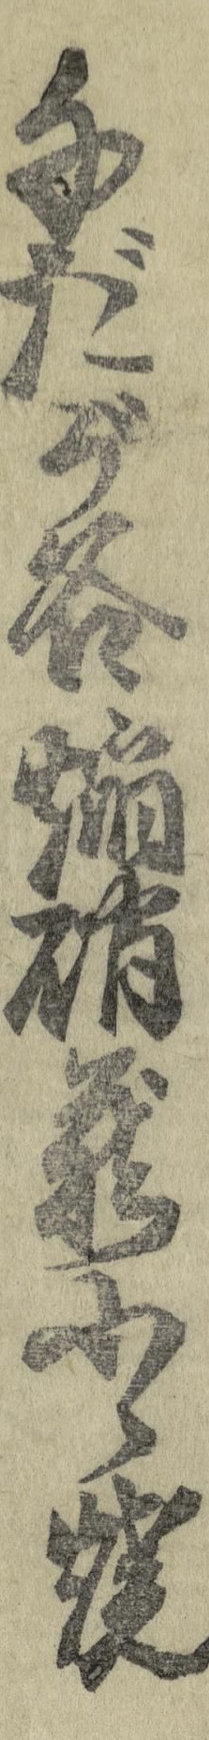千だが谷焔硝蔵少々焼
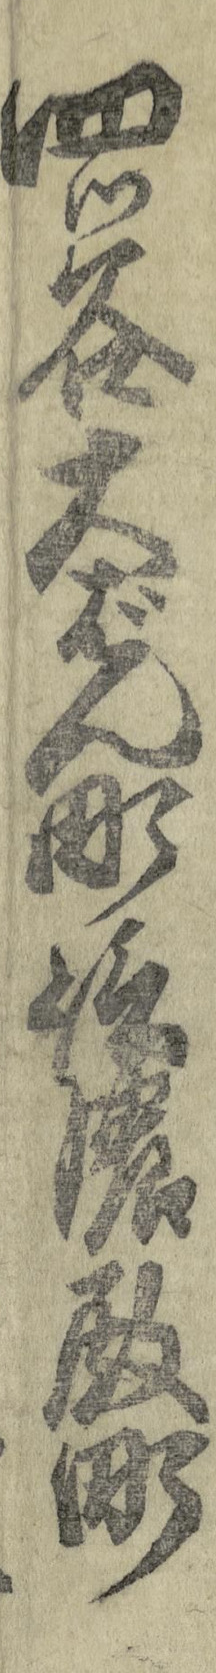四ツ谷大ばん町信濃殿町
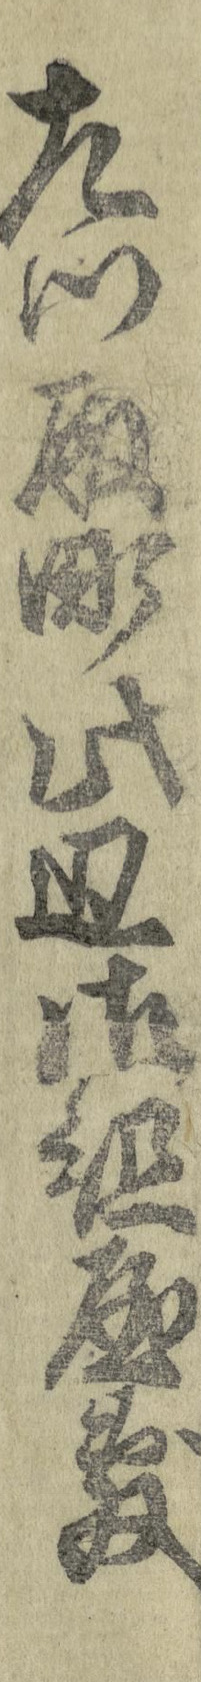左門殿町此辺御組屋敷
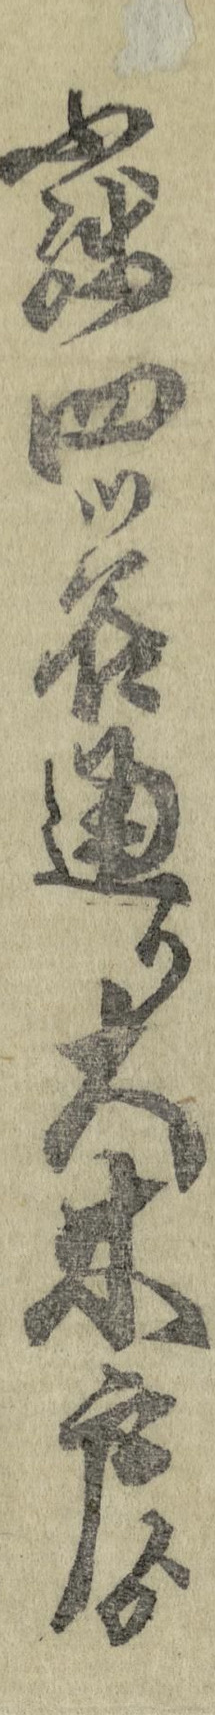不残四ツ谷通り大木戸ゟ
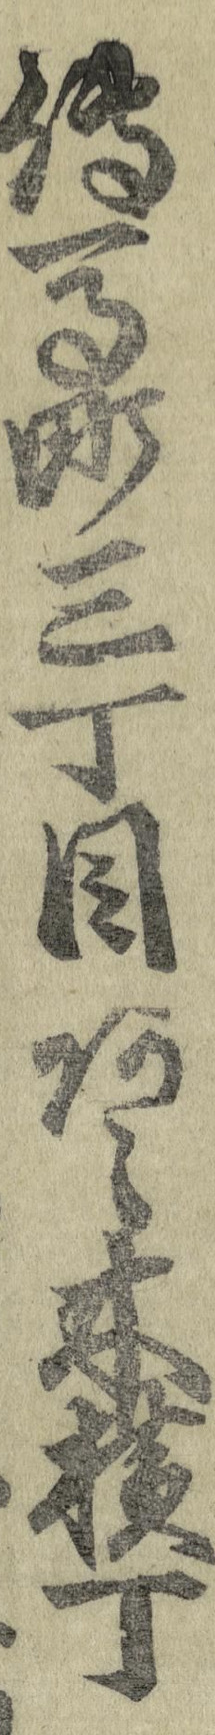伝馬町三丁目あら木横丁
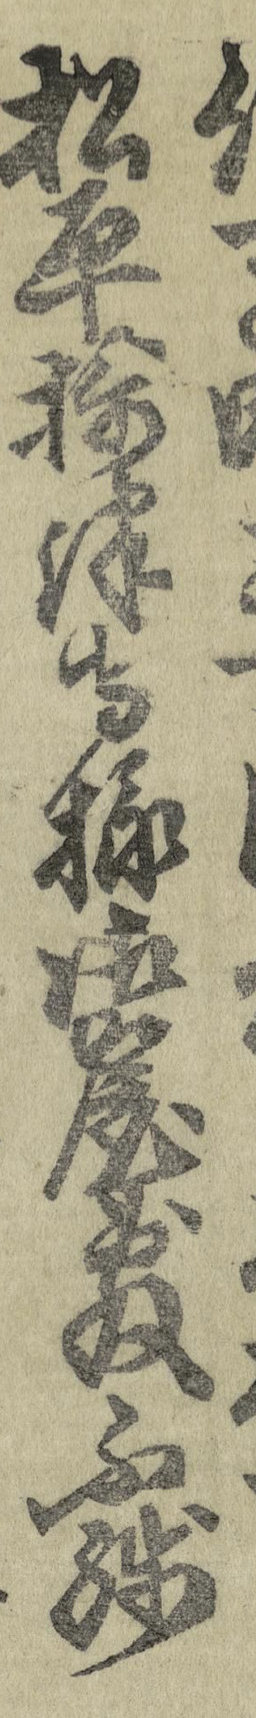松平摂津守様御屋敷不残
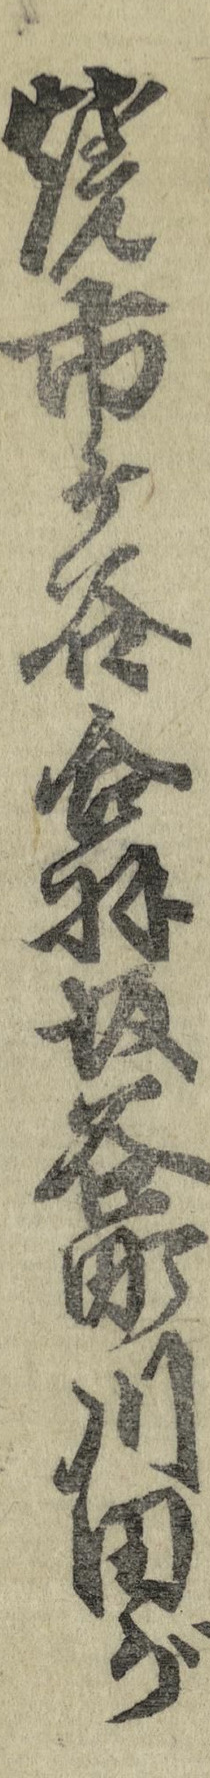焼市ヶ谷合羽坂谷町川田が
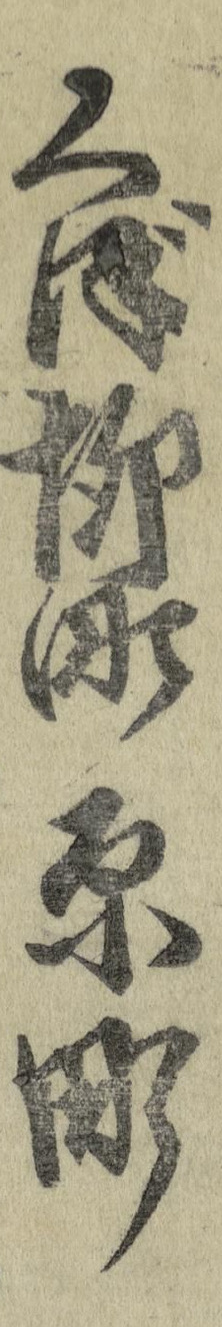くぼ柳町原町
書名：江戸大火本しらべ
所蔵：東京大学地震研究所図書室 Earthquake Research Institute Library, The University of Tokyo, JAPAN
